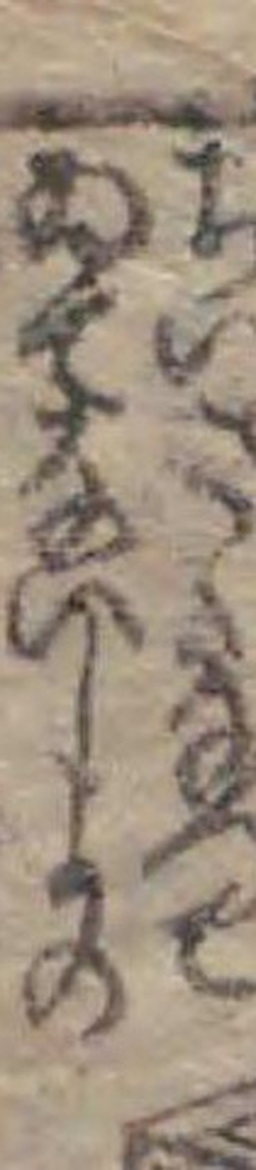ゐてないしよの
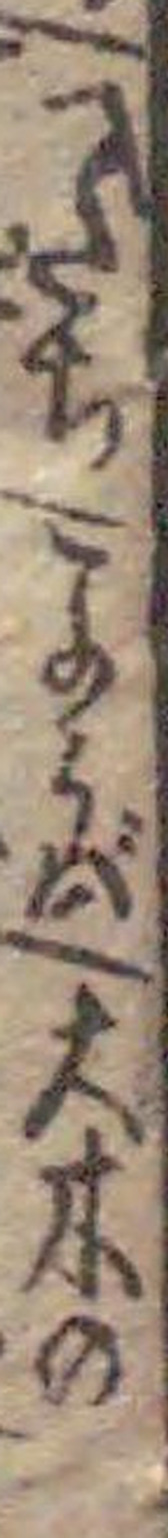〽たちよらば大木の
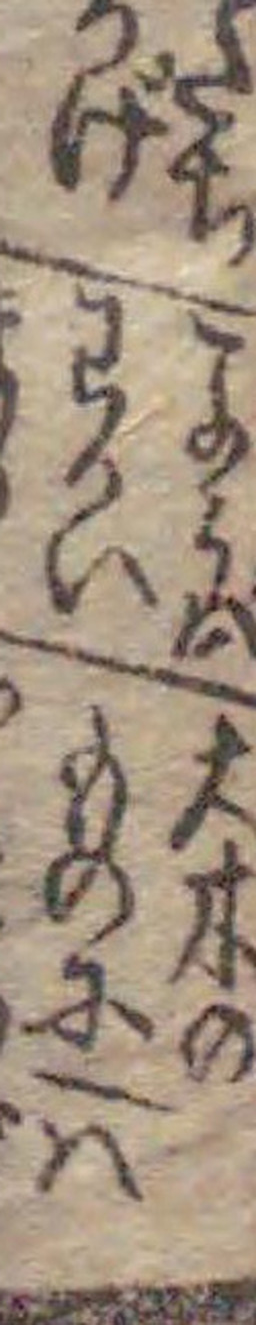かげわかいものには
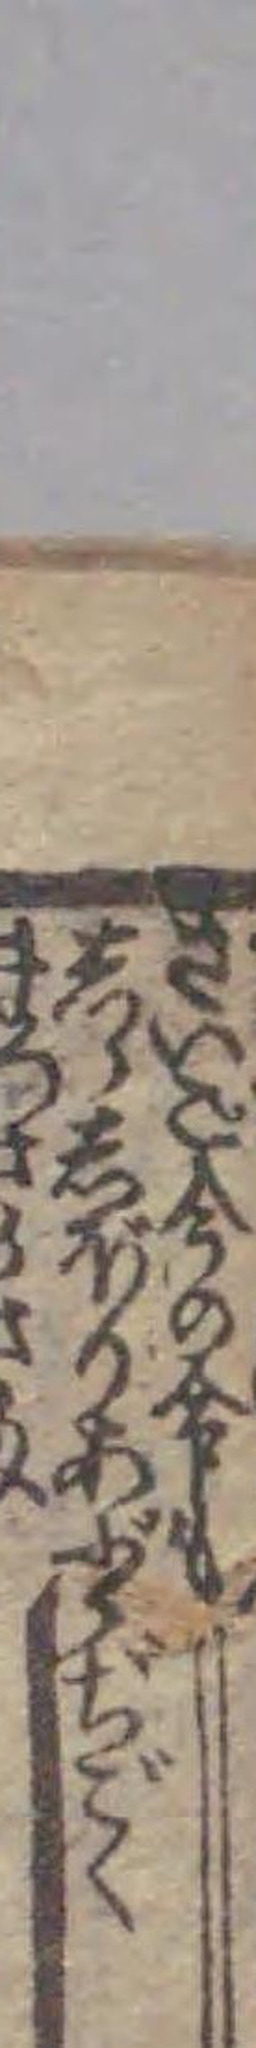しらしぼりあぶらぢごく
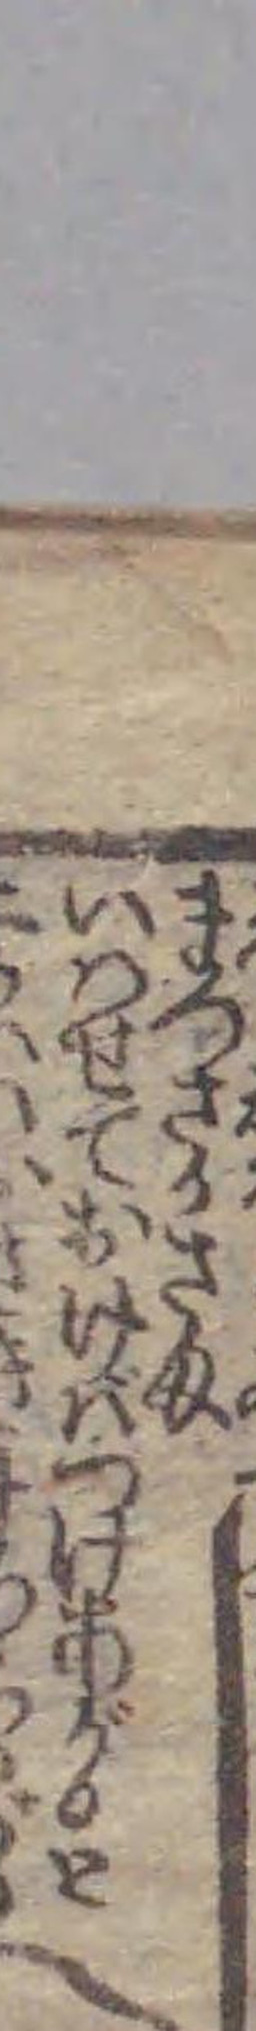いはせておけばつけあがると
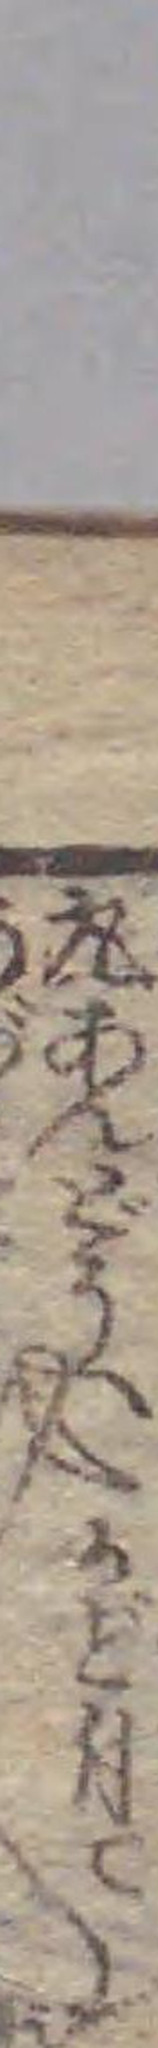丸あんどうかど付て
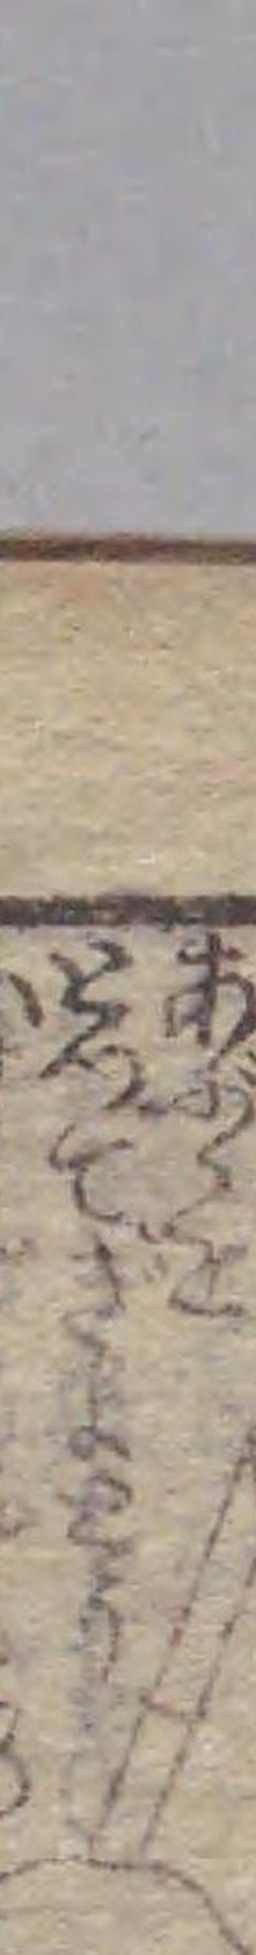とつてぎよとう
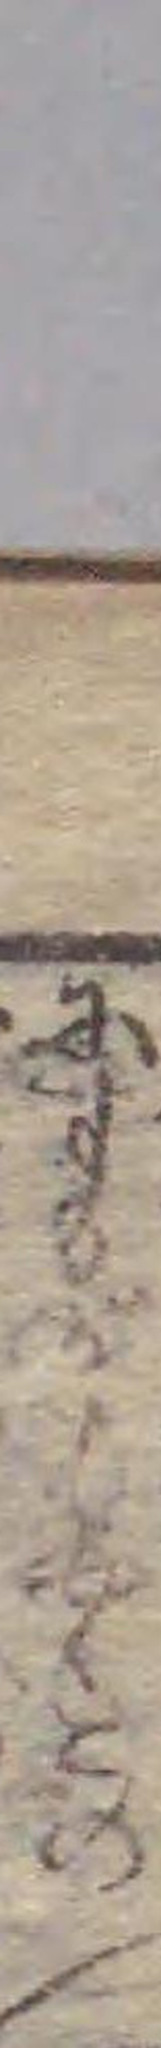にするがはやくこの
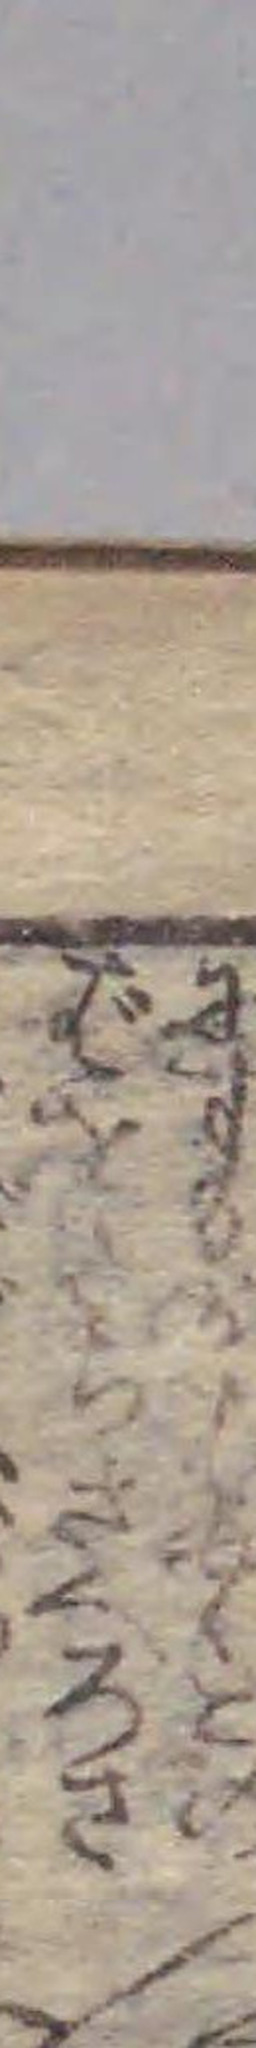ばをたちきへろさ
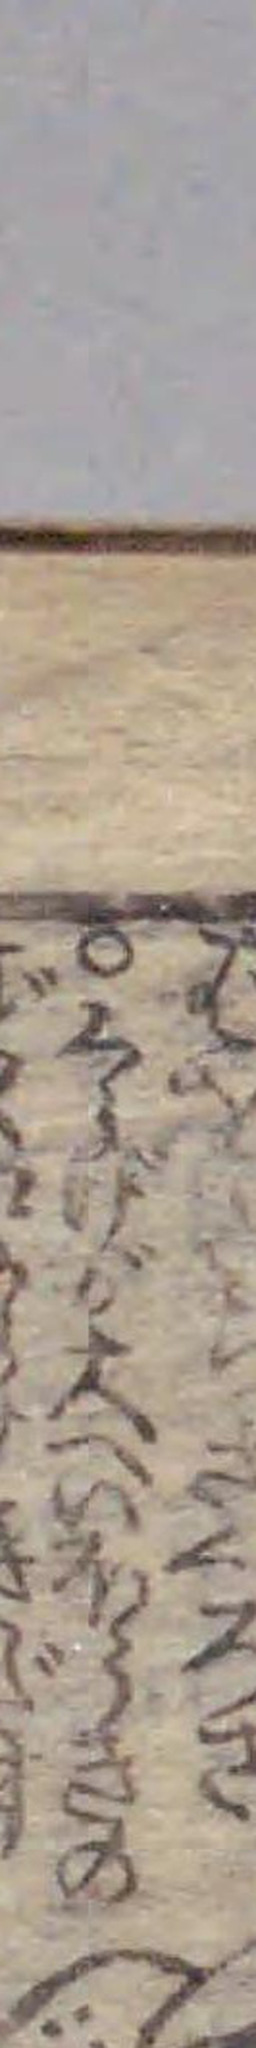○くらげが大へいほうきの
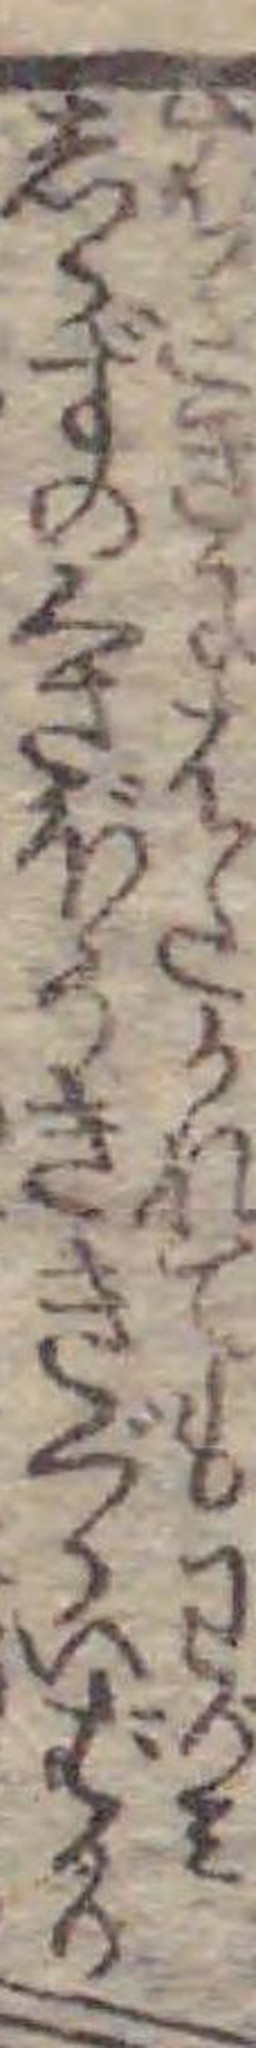しらずのくさぼうききぐらいばかり
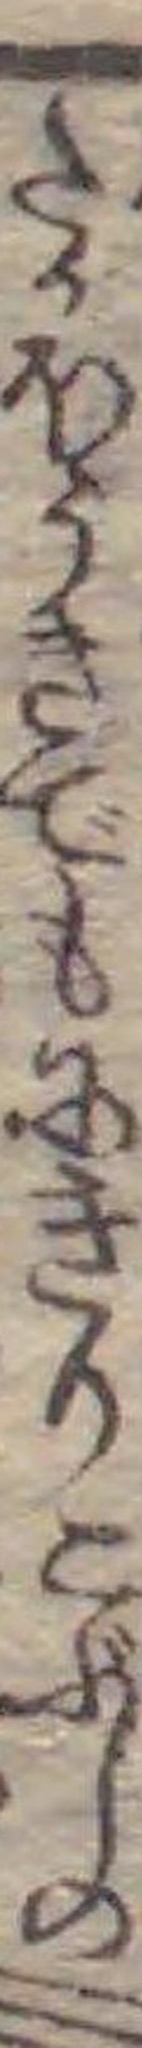たかほうきでもにきりこぶしの
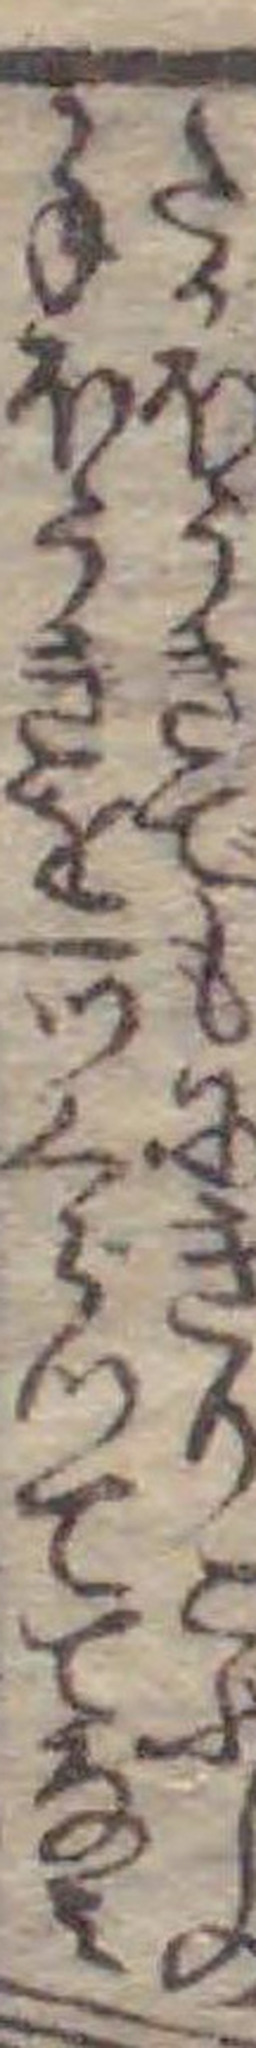子ほうきを一つくらつててなみ
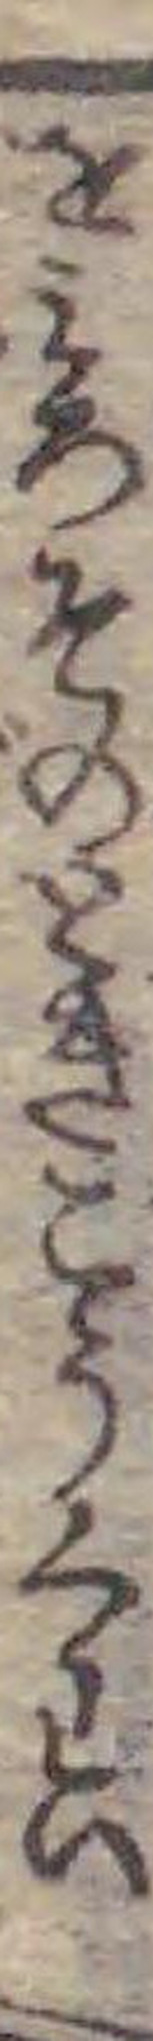をみろそのときこうくわい
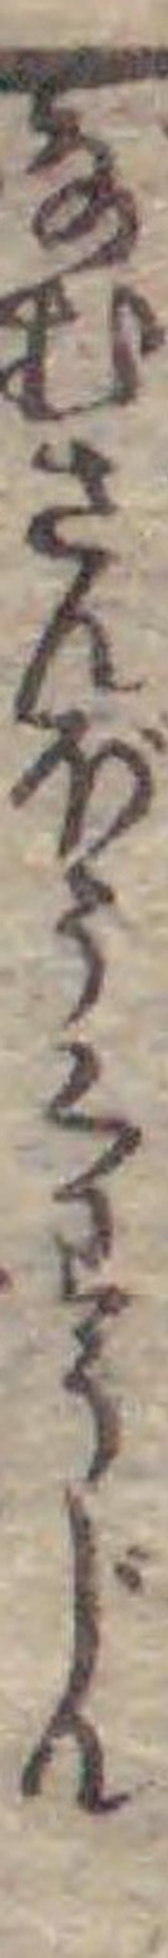なむさんぼうくわうじん
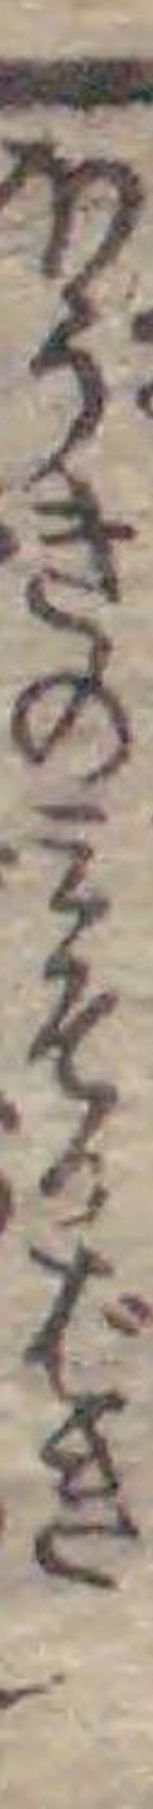ほうきのみそかばき
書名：竜宮苦界玉手箱 : 3巻
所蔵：国立国会図書館 National Diet Library, JAPAN
